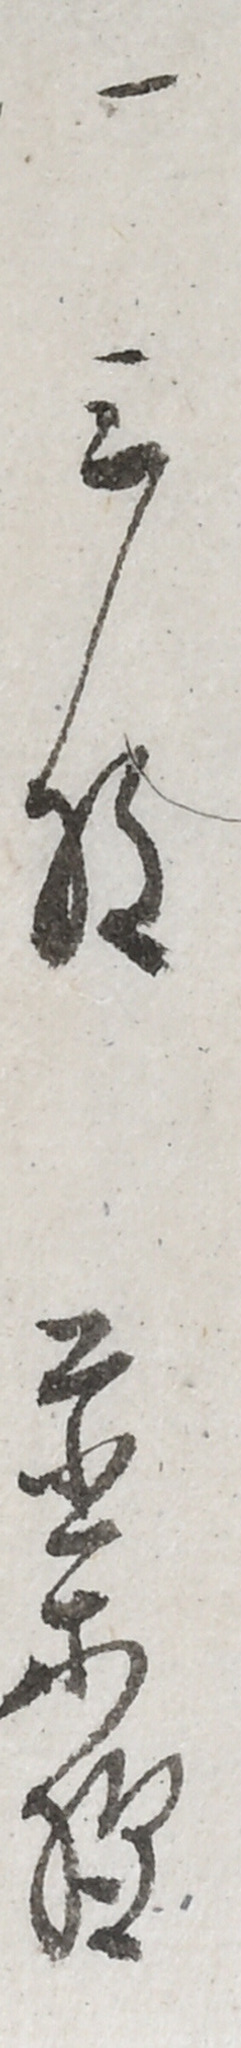一三枚並木様
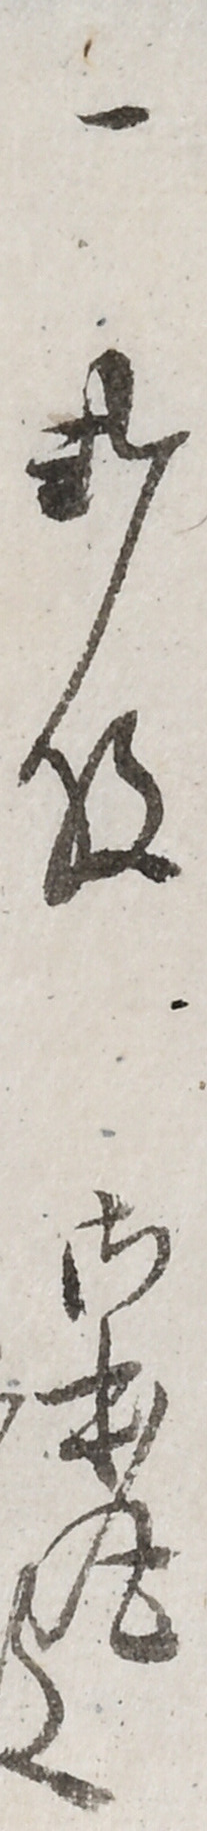一弐枚御殿
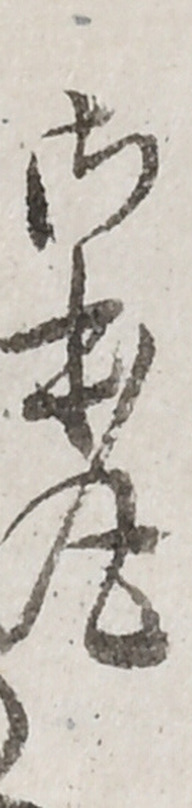御本丸
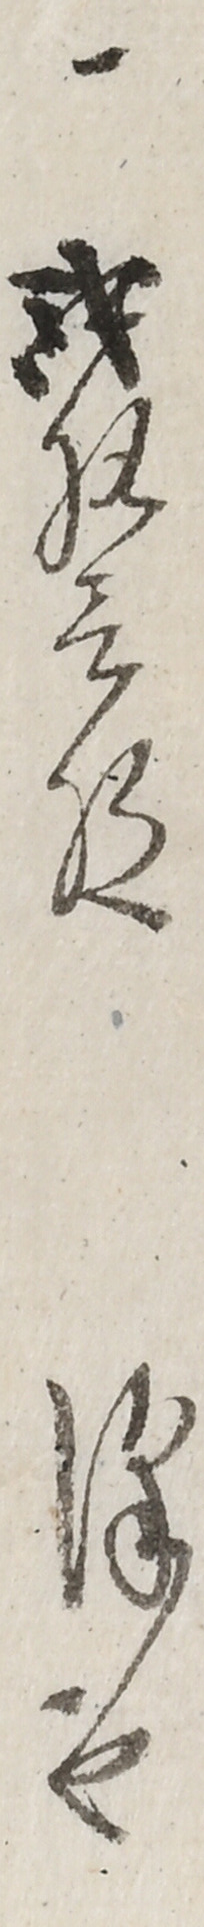一弐十壱枚沢や
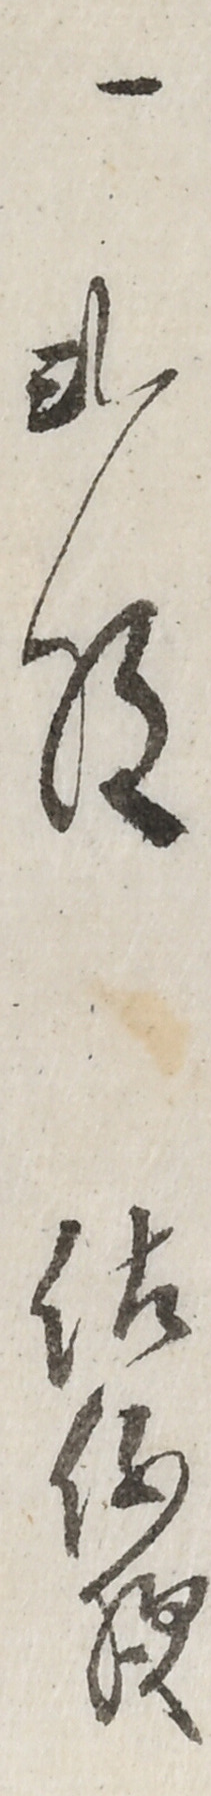一弐枚佐伯様
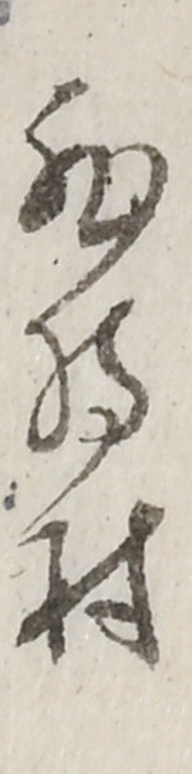非持村

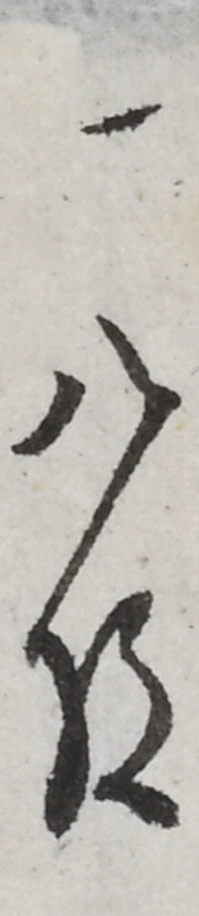一八枚
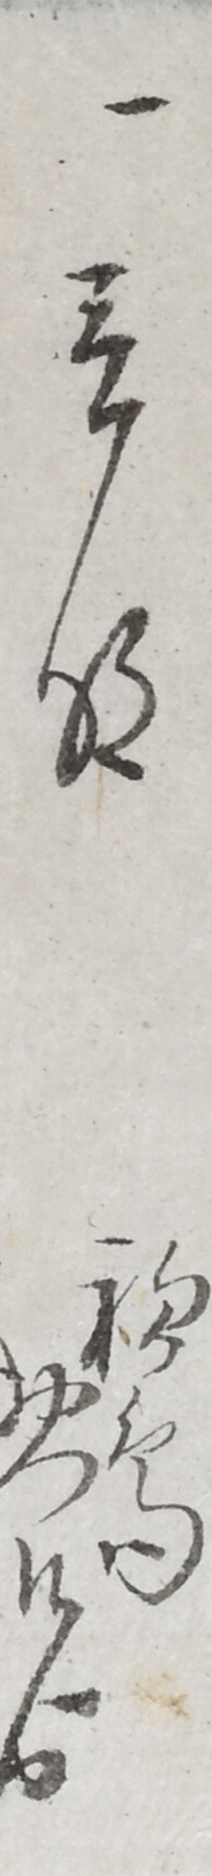一壱枚庄治
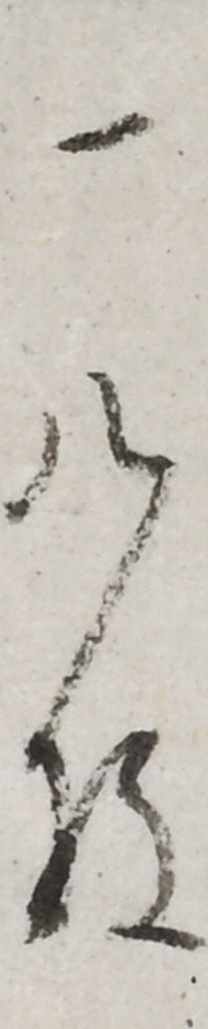一八枚
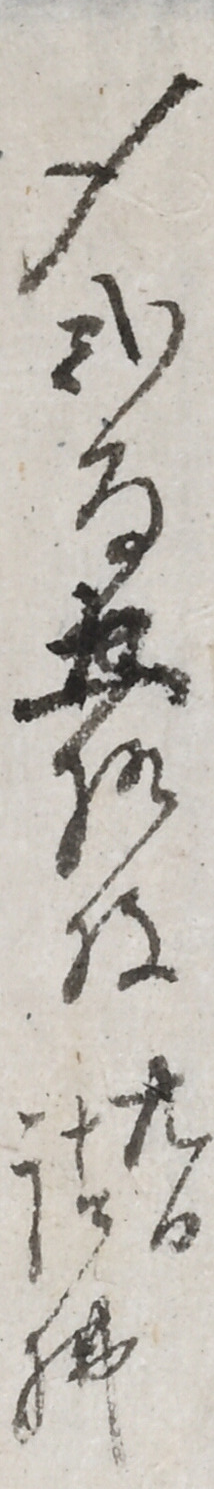〆弐百五拾枚廿日
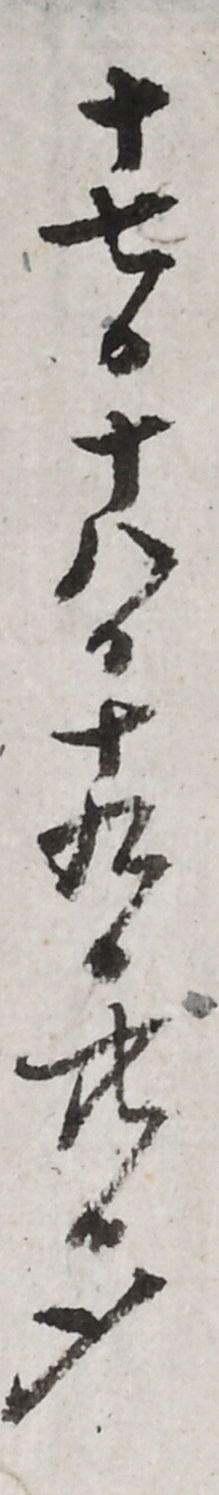十七日十八日十九日廿日〆
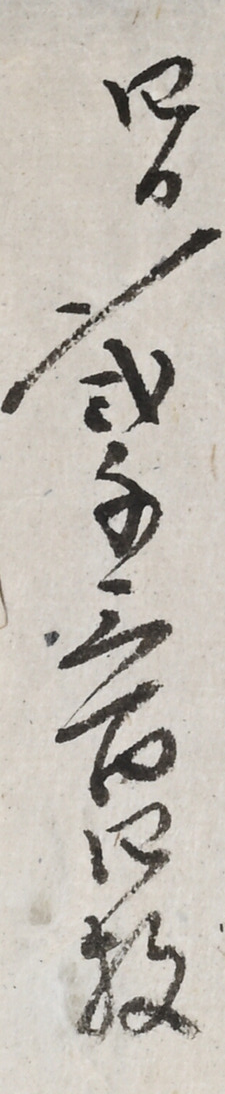四日〆弐千三百四枚
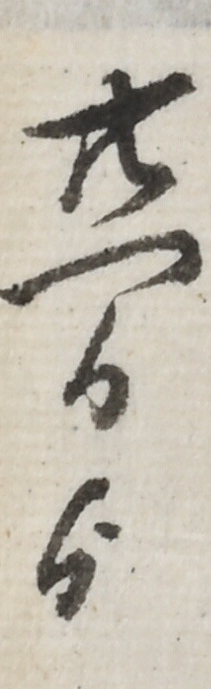廿一日ゟ
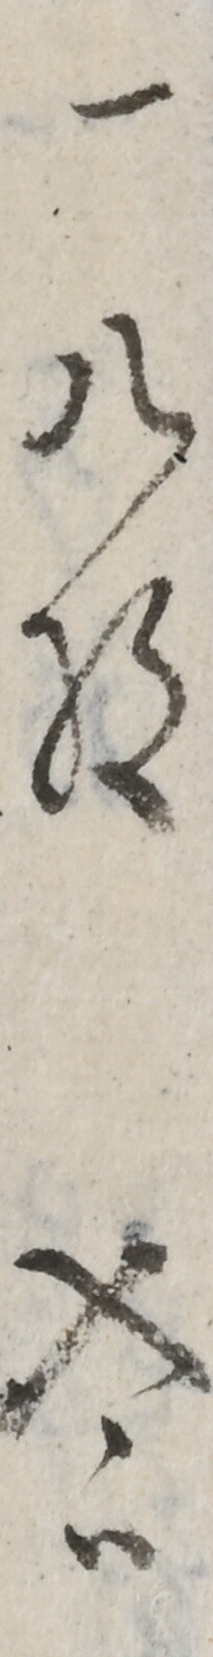一八枚穂島
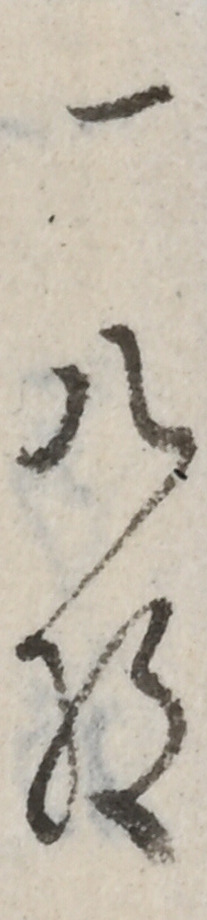一八枚
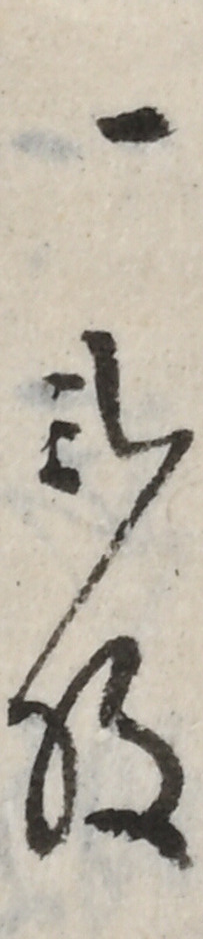一八枚
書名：髙遠限楮幣引換覚帳
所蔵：伊那市立高遠町図書館・合同会社AMANE
